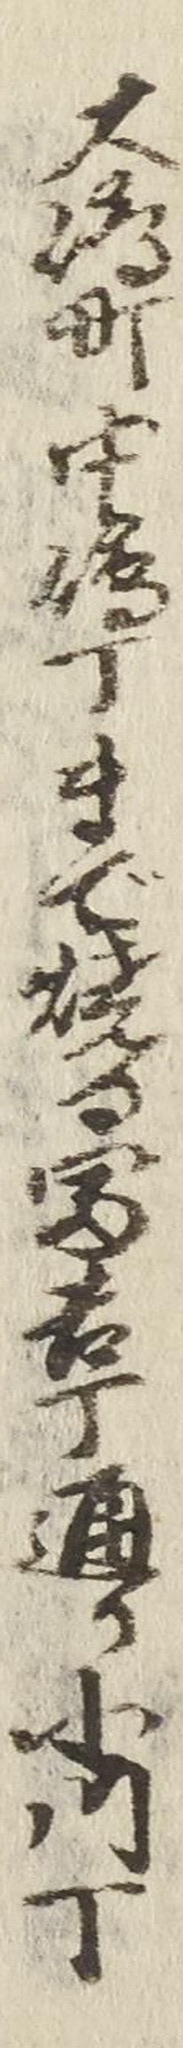大嶋町中嶋丁まで焼る富吉丁通り小川丁
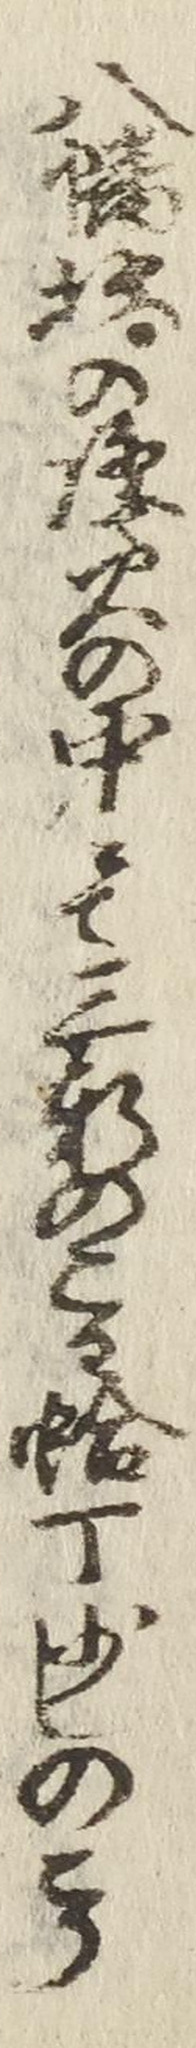八幡橋の際火の中にて三軒のこる蛤丁少しのこり
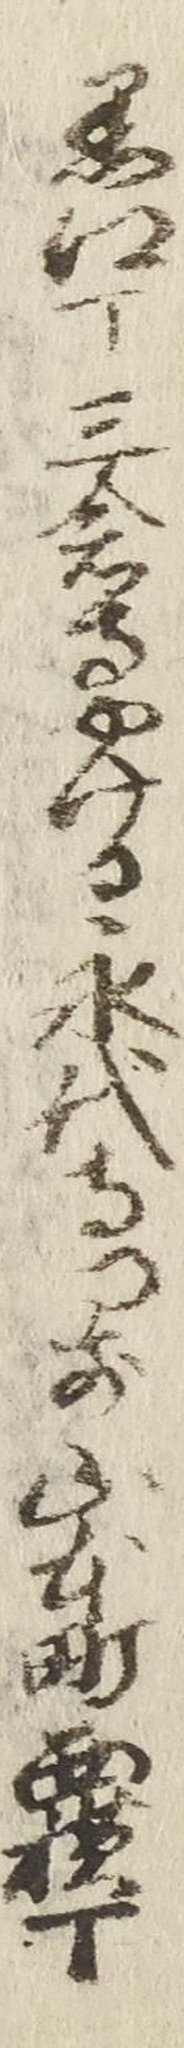黒江丁三倉寺やける永代寺門前山本町西横丁
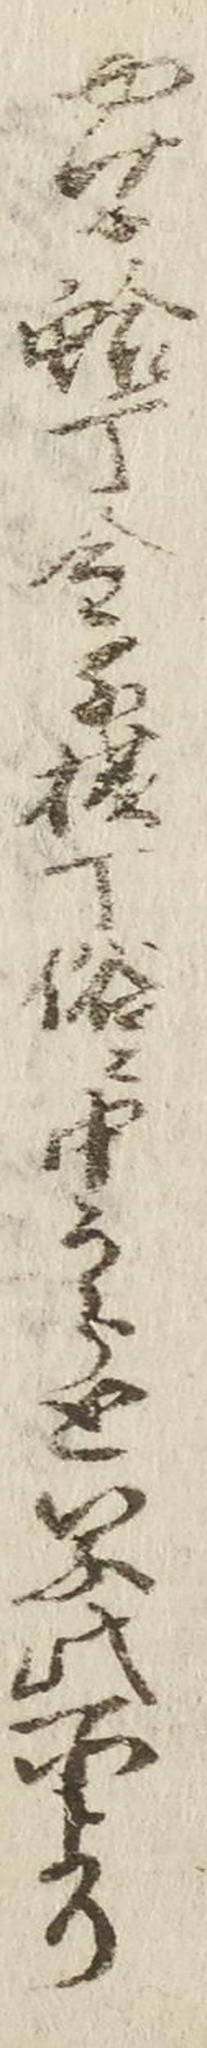やける蛤丁金子横丁俗に中うらといふ此所より
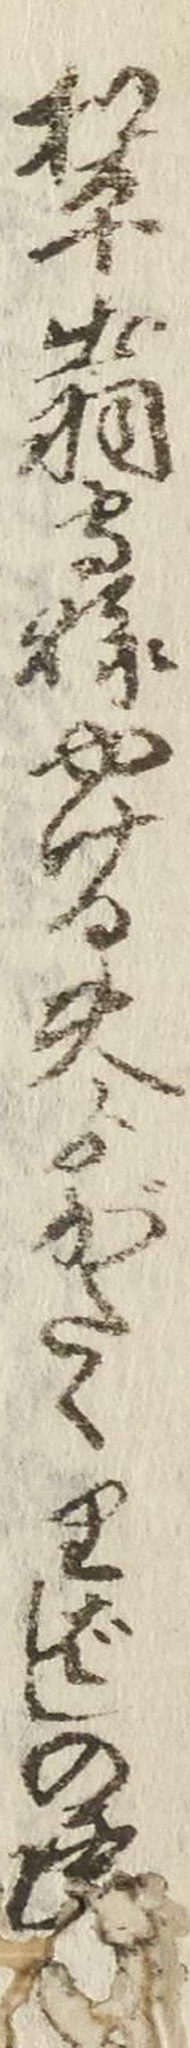松平出羽守様やける夫ゟがたくりばしの際にて
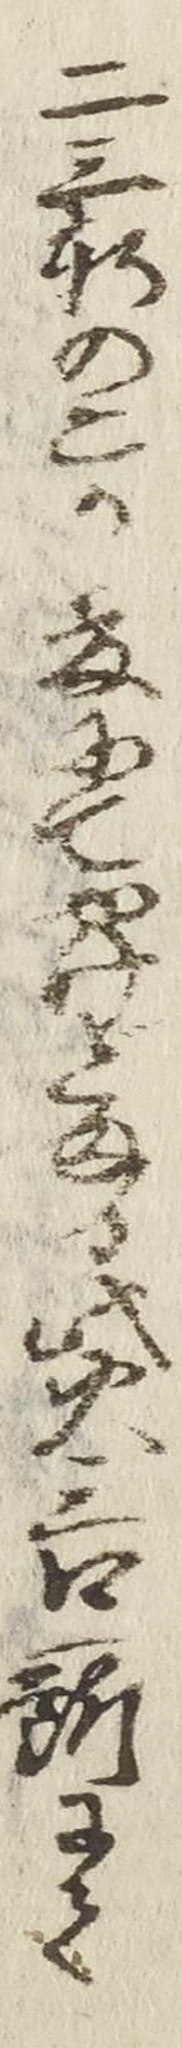二三軒のこり爰にてやけどまる此火三口一所にて
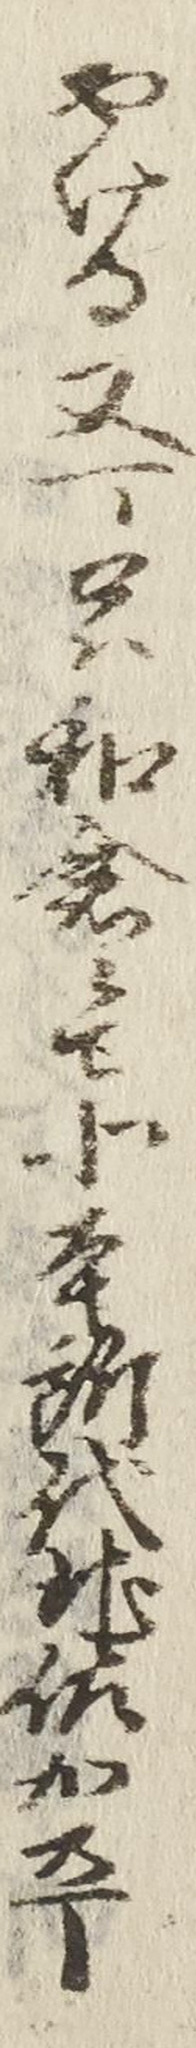やける又一ㇳ口は和倉にて北本所代地佐賀丁
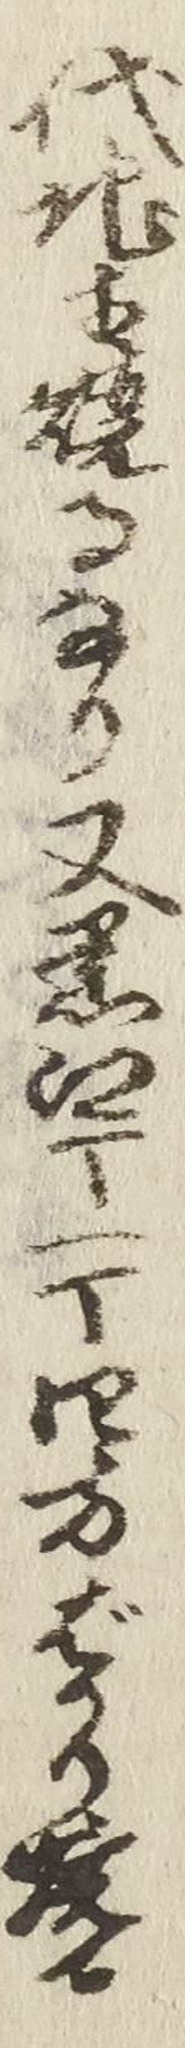代地等焼るなり又黒江丁一丁四方ばかり焼る
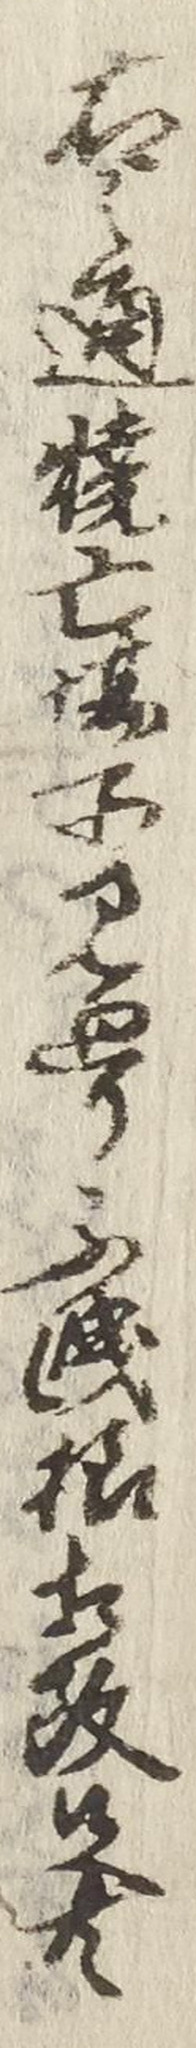右の通焼亡場所見廻り不洩様相改候へ共
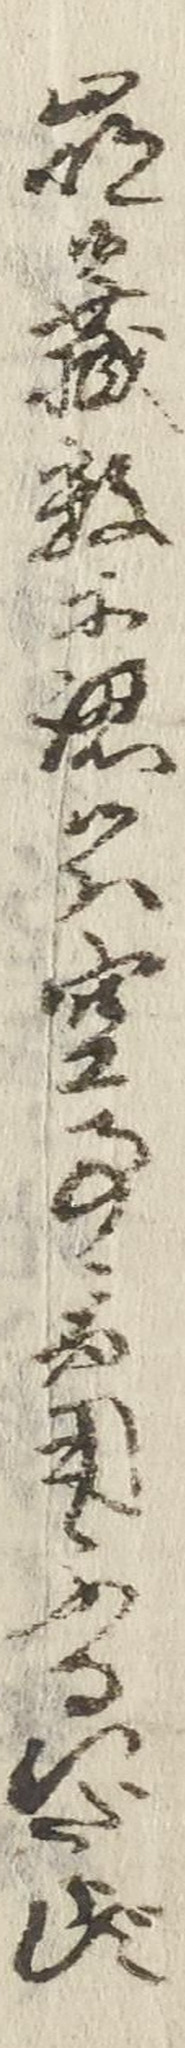崩候蔵数等認候は空事二而用ふるにいたらず
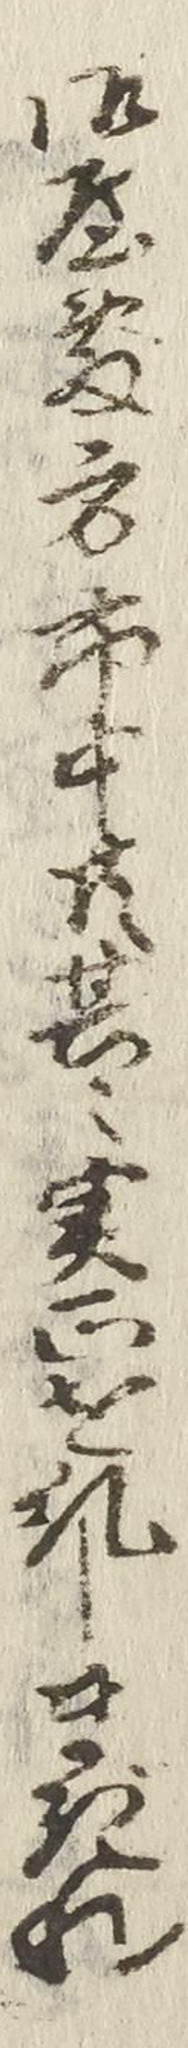御屋敷方市中共其々実正を糺しまぎれ
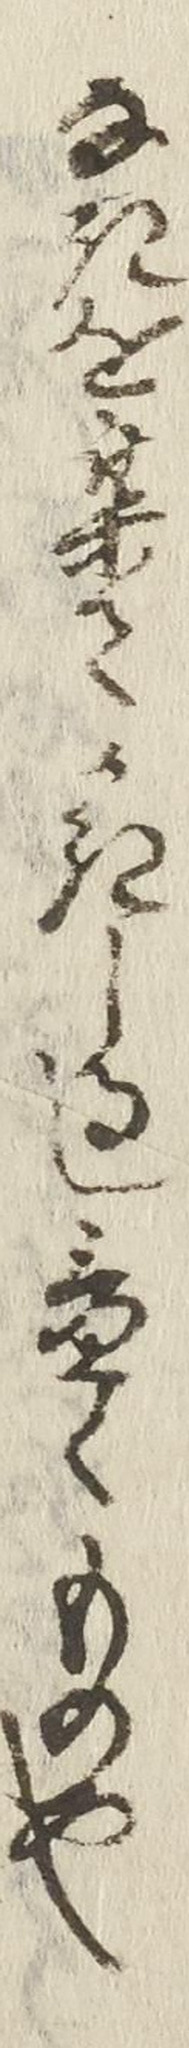なきを集てかきしるし置くもの也
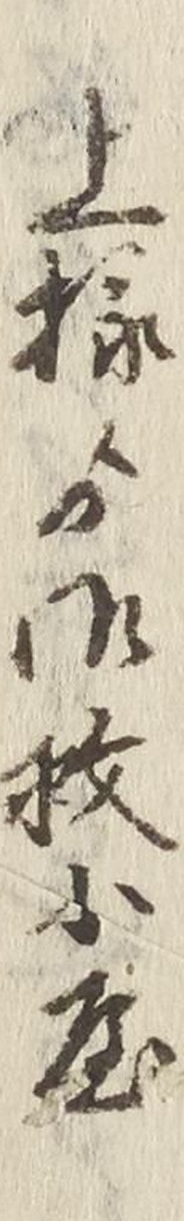上様ゟ御救小屋
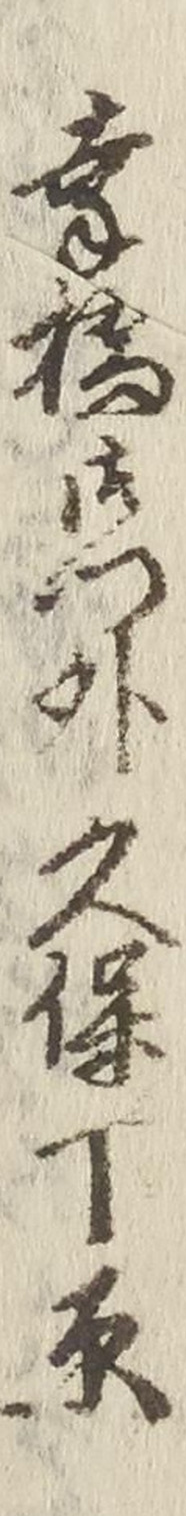幸橋御門外久保丁原
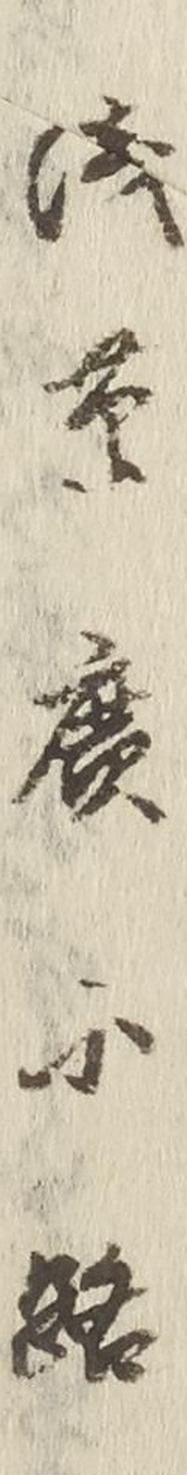浅草広小路
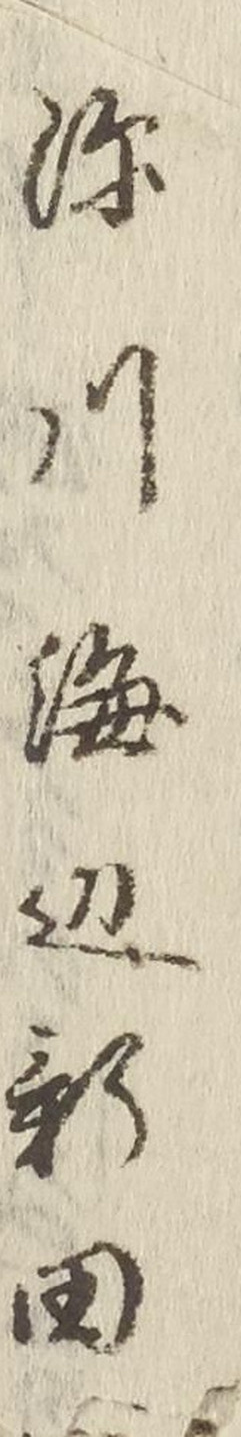深川海辺新田
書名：地震出火　男女死人怪我人書上之寫
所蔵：東京大学地震研究所図書室 Earthquake Research Institute Library, The University of Tokyo, JAPAN
